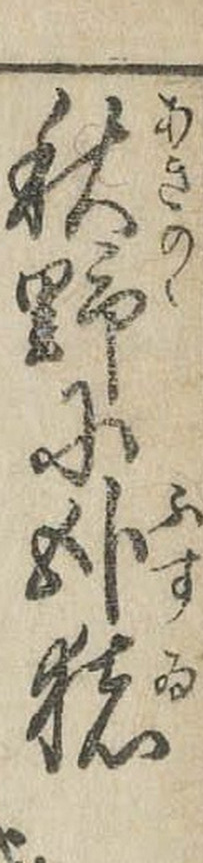秋野に臥猪
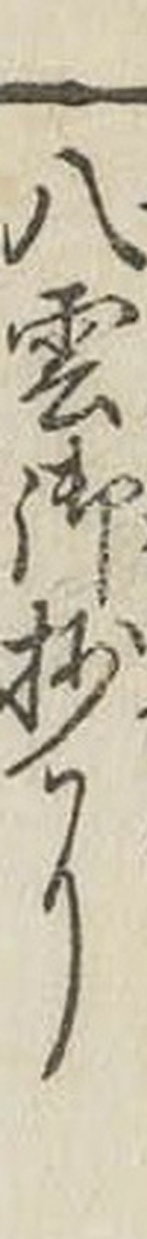八雲御抄に
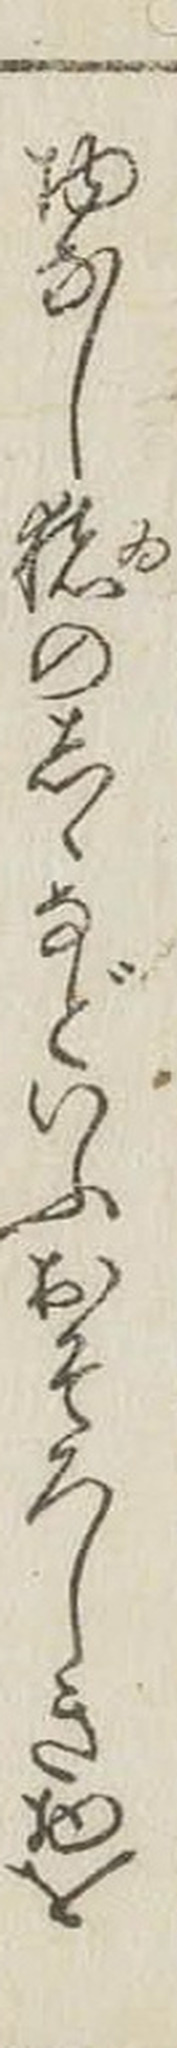物なし猪のしゝなどいふおそろしき物を
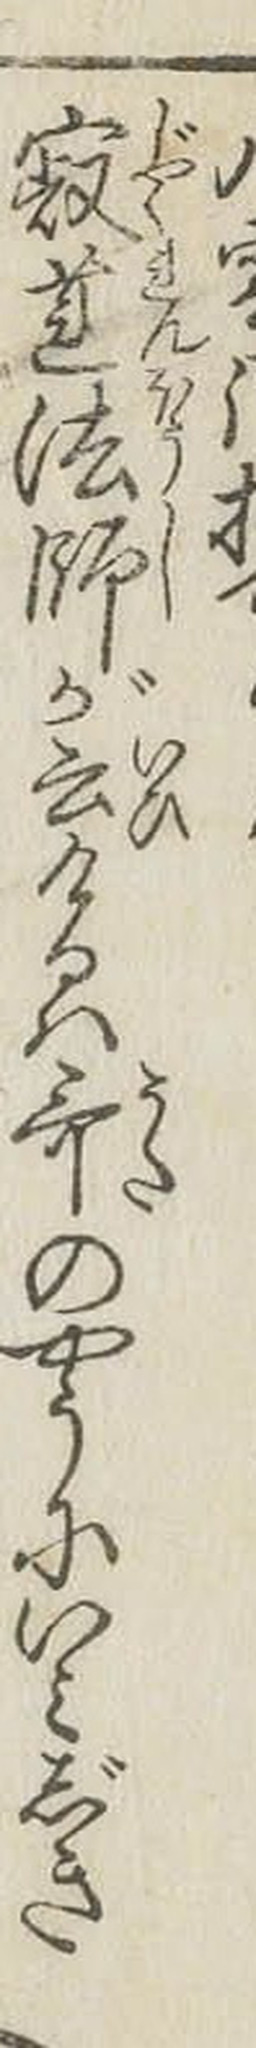寂蓮法師が云けるは哥のやうにいみじき
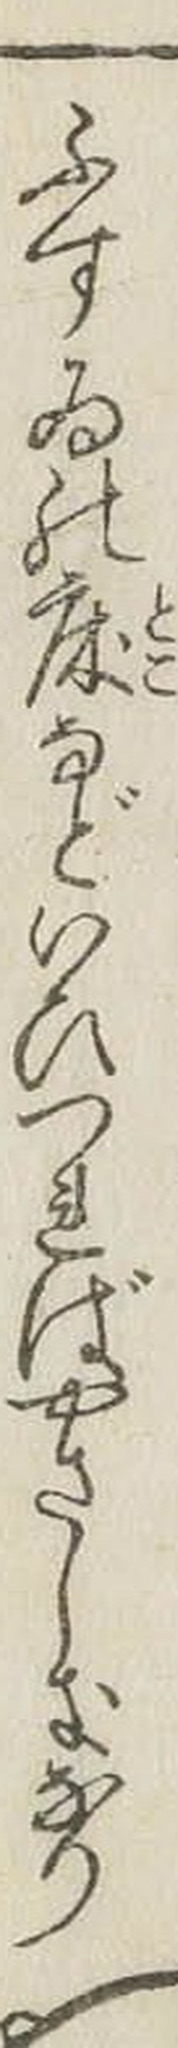ふすゐの床などいひつればやさしきなり
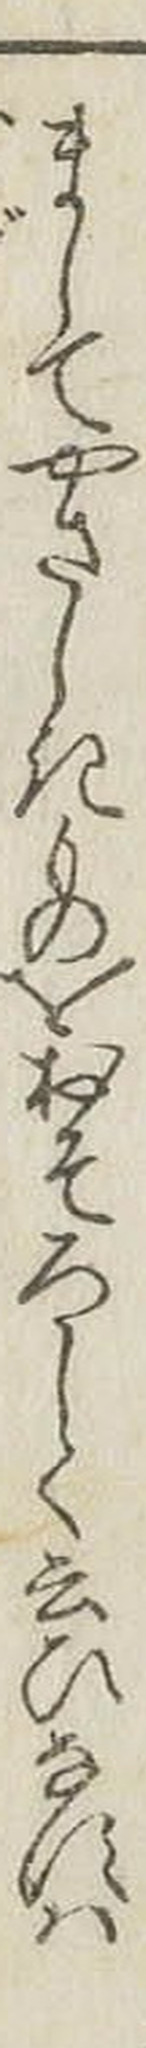ましてやさしきものをおそろしく云ひなすは
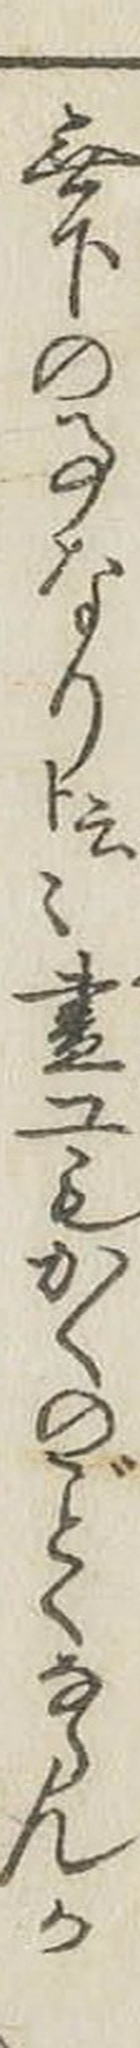無下の事なりト云々画工もかくのごとくならんか
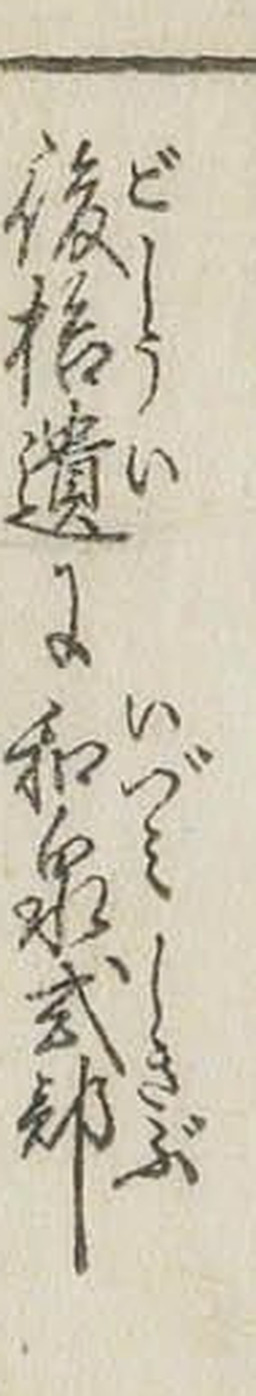後拾遺に和泉式部
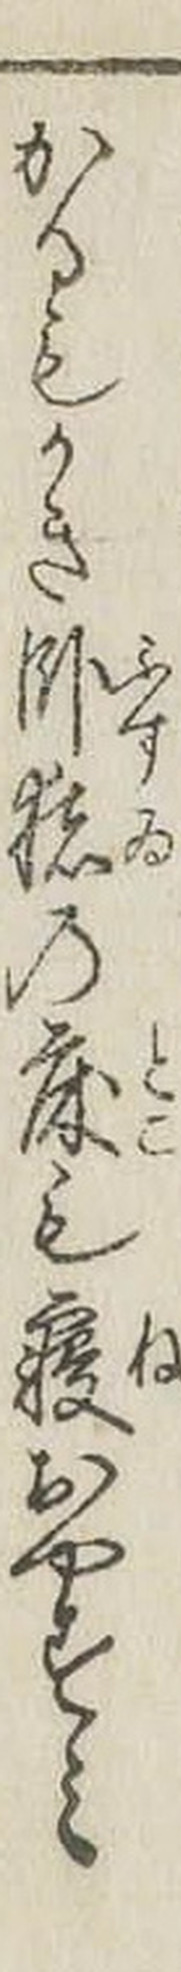かるもかき臥猪の床も寝おやすみ
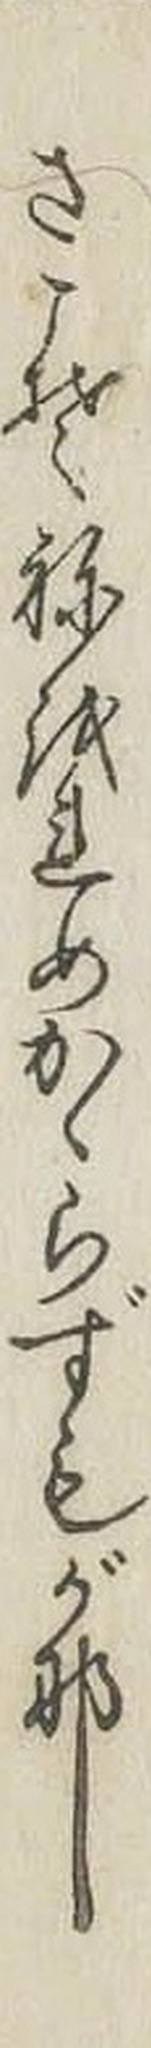さこそねをれめかゝらずもがな
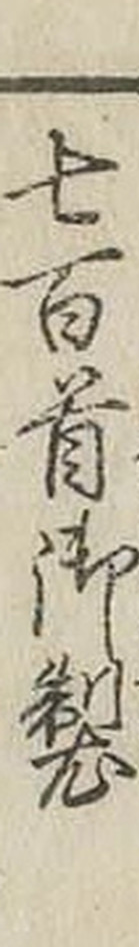七百首御製
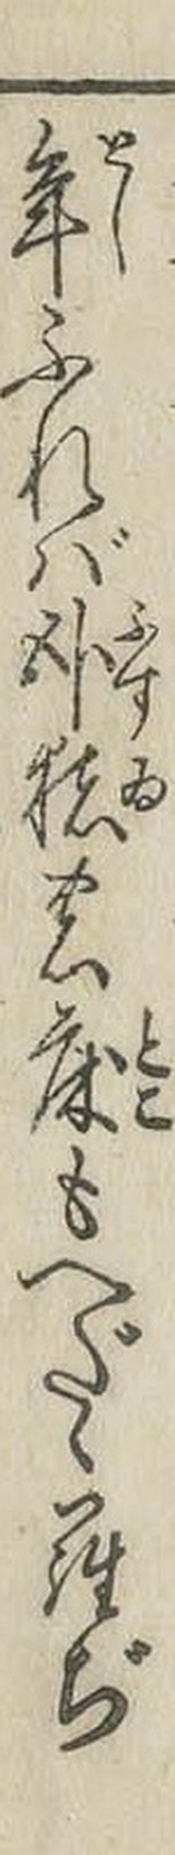年ふれば臥猪の床もへだゝらぢ
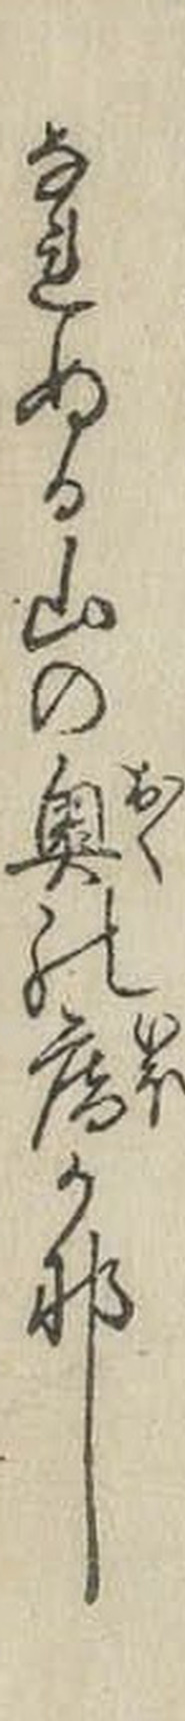なれぬる山の奥の廬かな

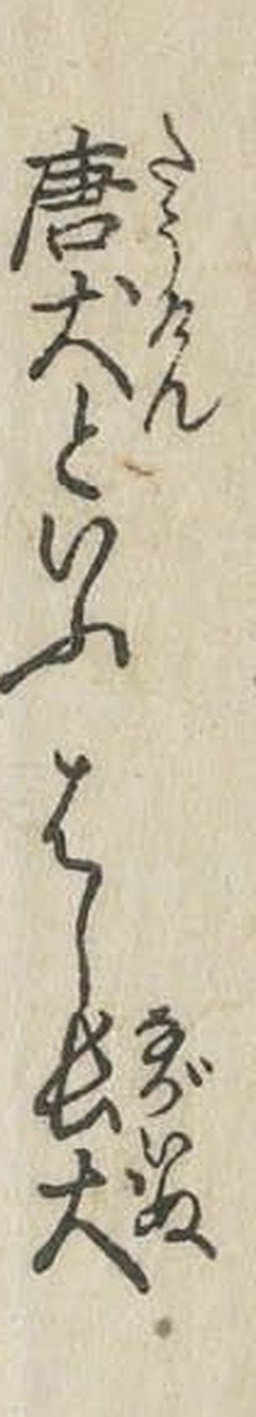唐犬といふはし長犬
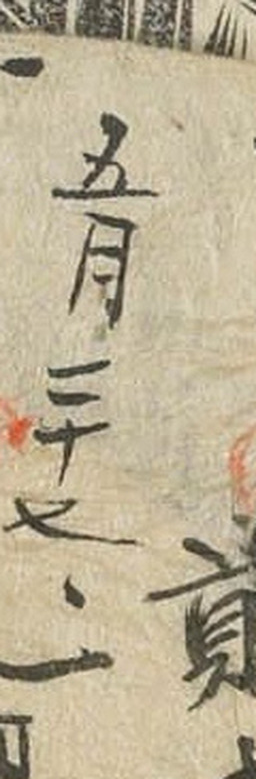五月二十七・
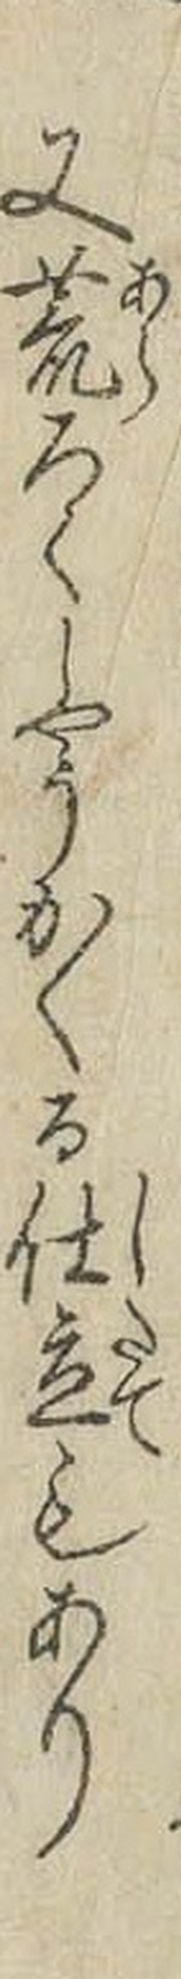又荒ろくしやうかくる仕立もあり
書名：絵本写宝袋 9巻 9之巻上
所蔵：東京学芸大学教育コンテンツアーカイブ
